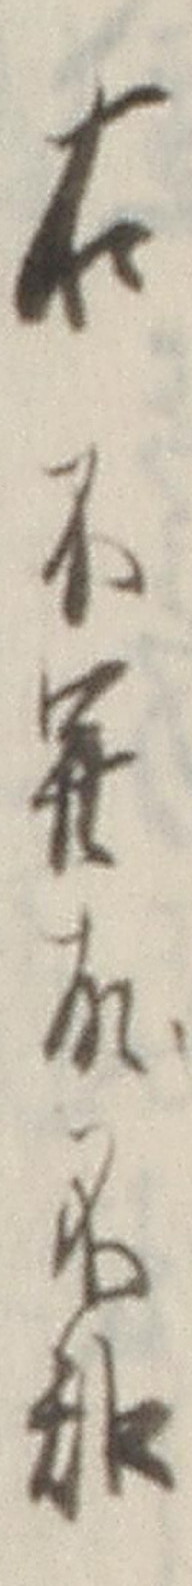右不開故不知
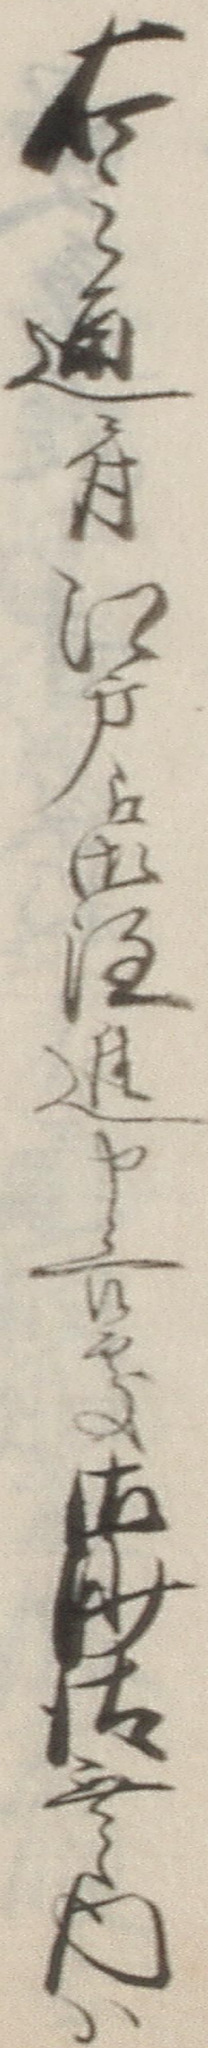右之通ニ付江戸え御注進申上候処御沙汰無之内ハ
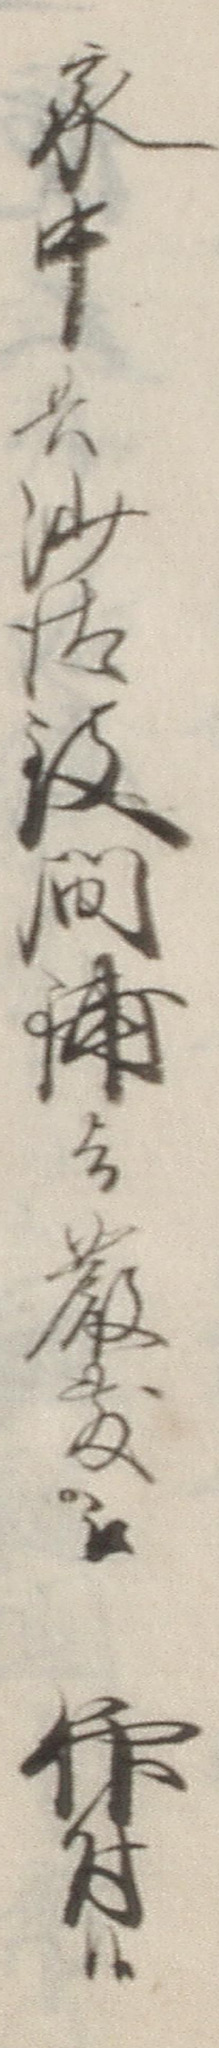家中共沙汰致間鋪旨厳敷被仰付候
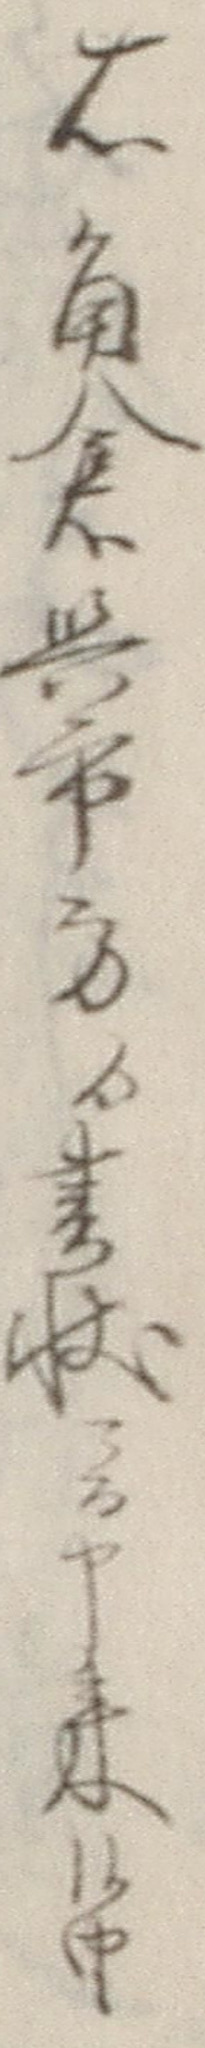右角倉與市方ゟ書状ニ而申来候
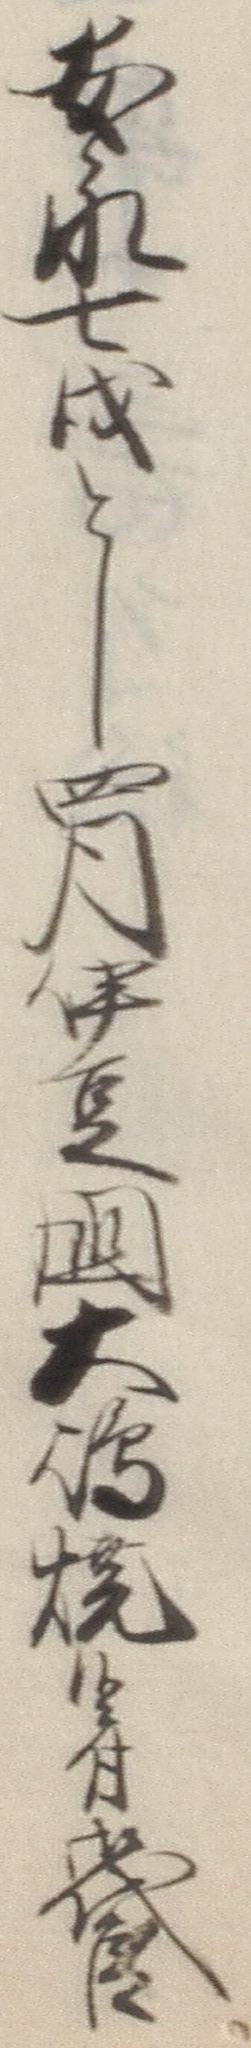安永七戌とし四月伊豆国大嶋焼候ニ付御代官
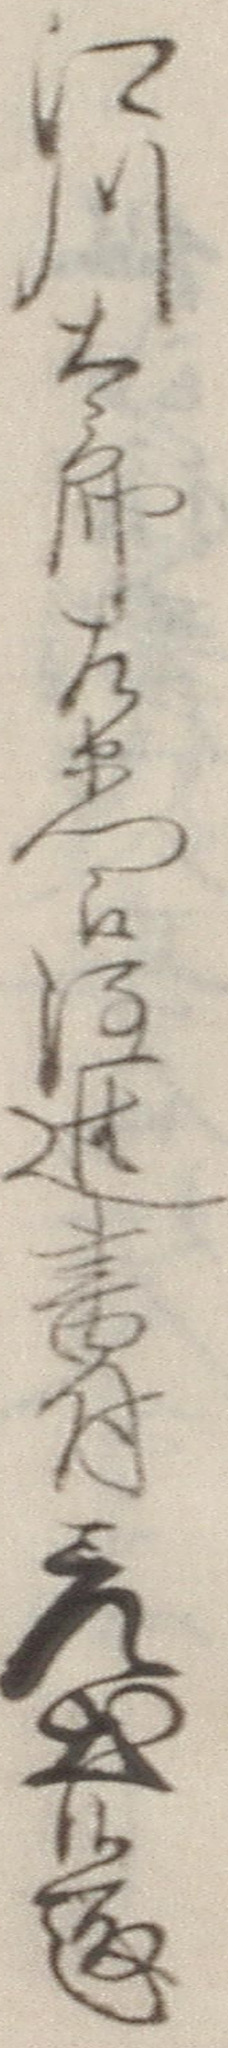江川太郎左衛門え注進書付差出候趣
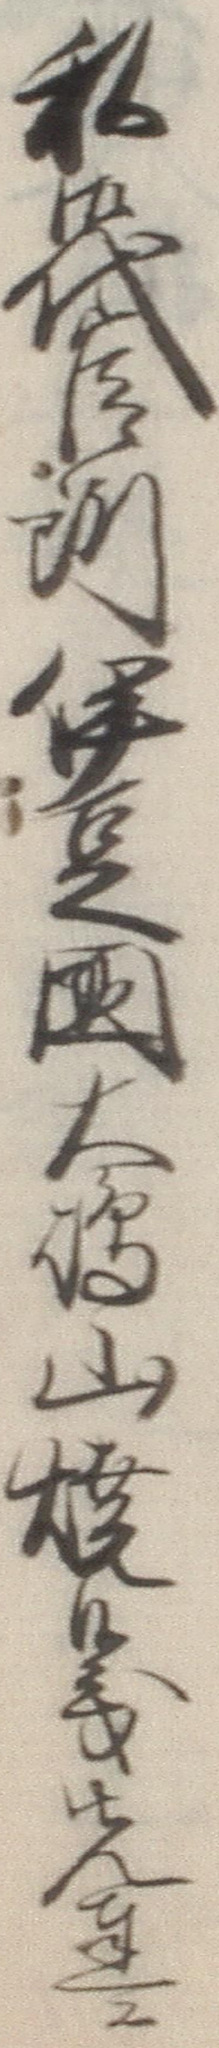私御代官所伊豆国大嶋山焼候義先達而
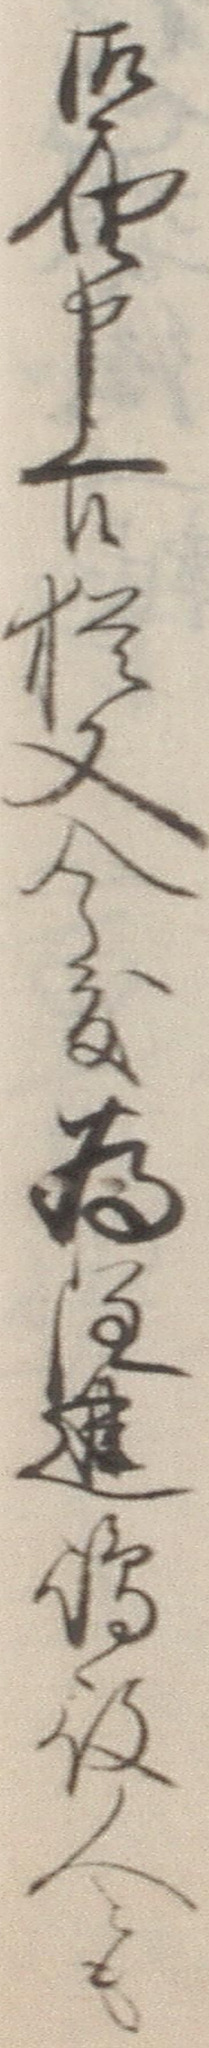御届申上候猶又今度為注進嶋役人とも
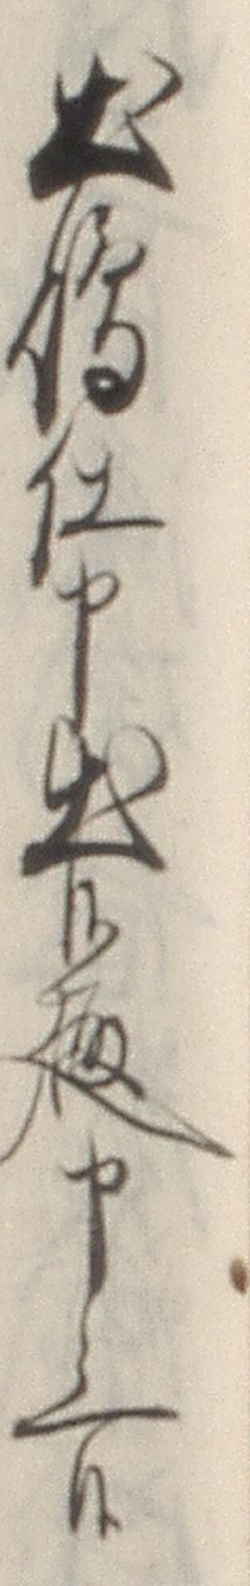出嶋仕申出候趣申上候
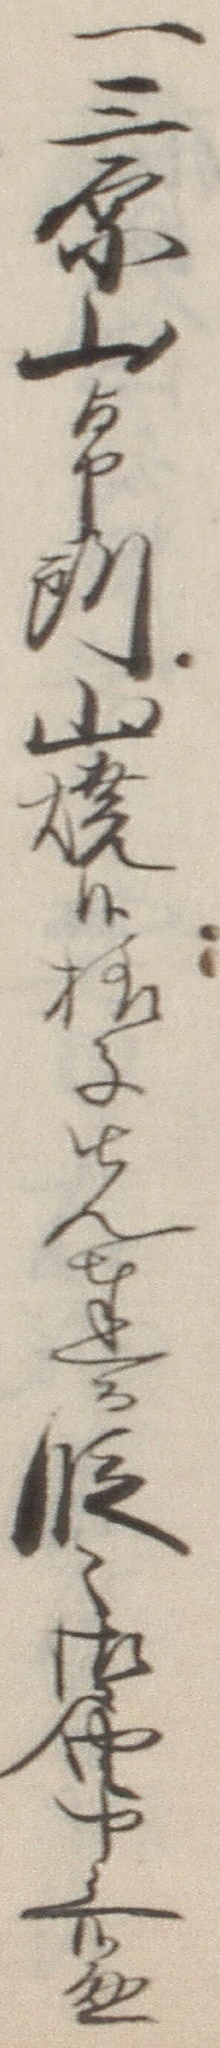一三原山と申所山焼候様子先達而段々御届申上候通
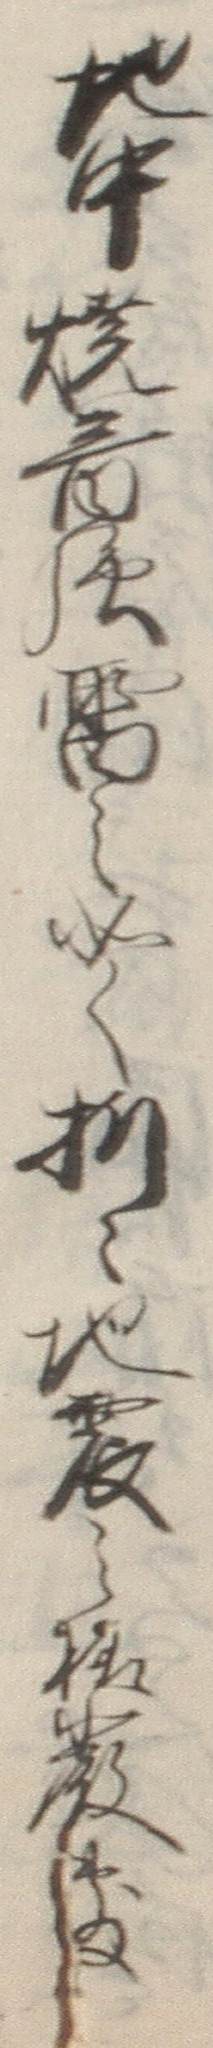地中焼音強雷之如く折々地震之様厳敷
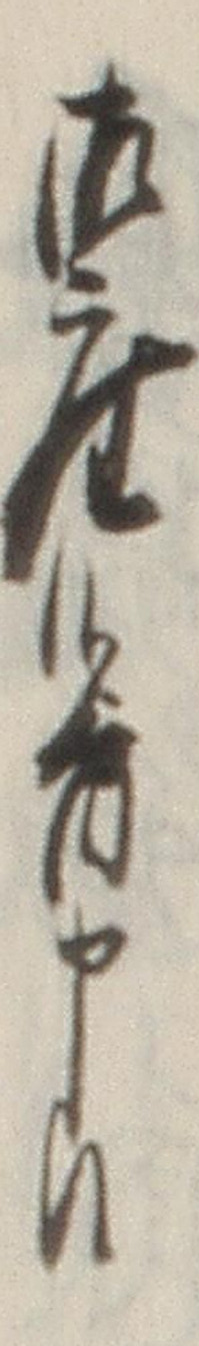御座候旨申候
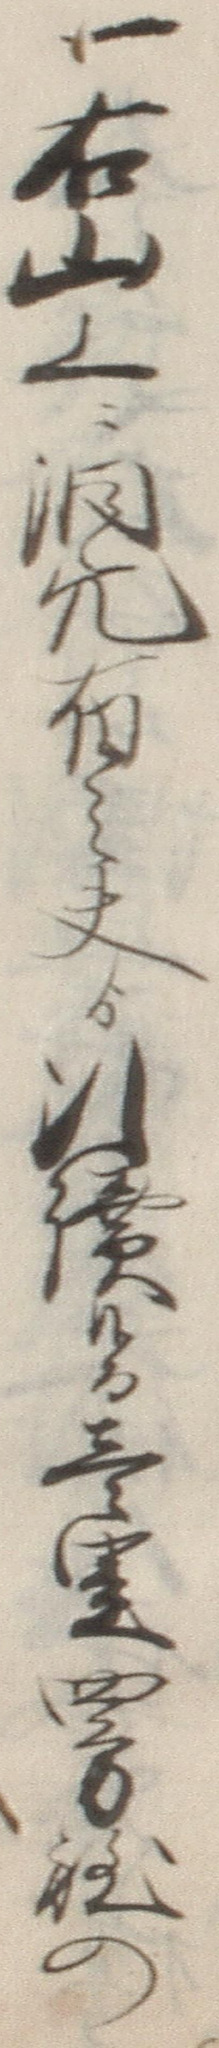一右山上ニ洞穴有之夫ゟ引続候間壱里四方程の
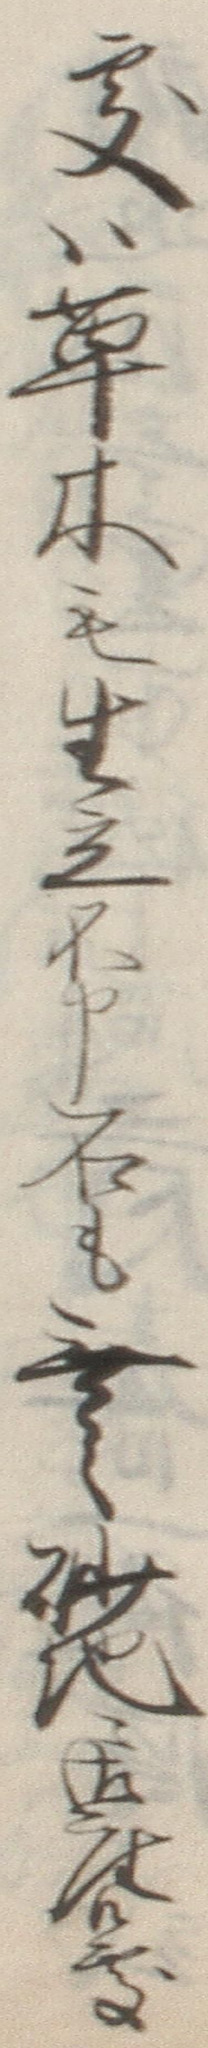処ハ草木も生立不申石も無之砂地ニ御座候処
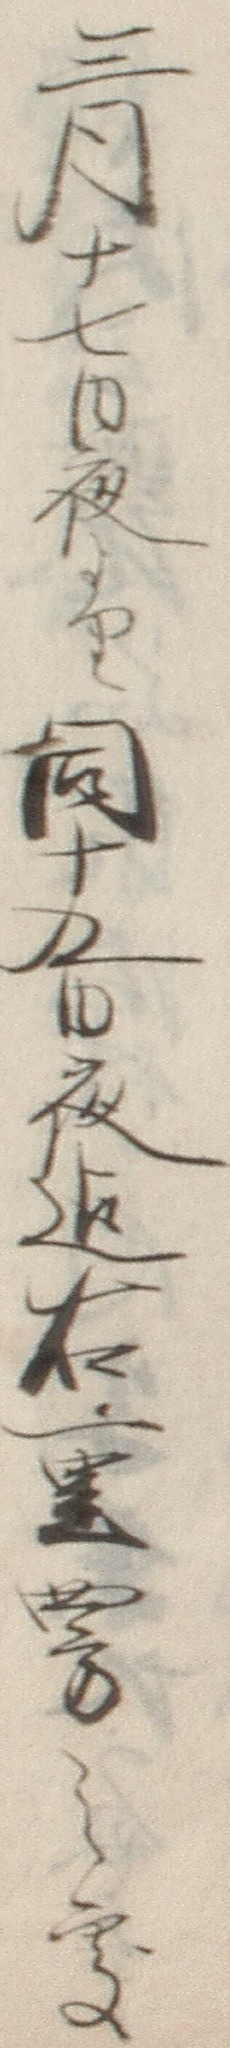三月十七日夜より同十九日夜迄右一里四方之処
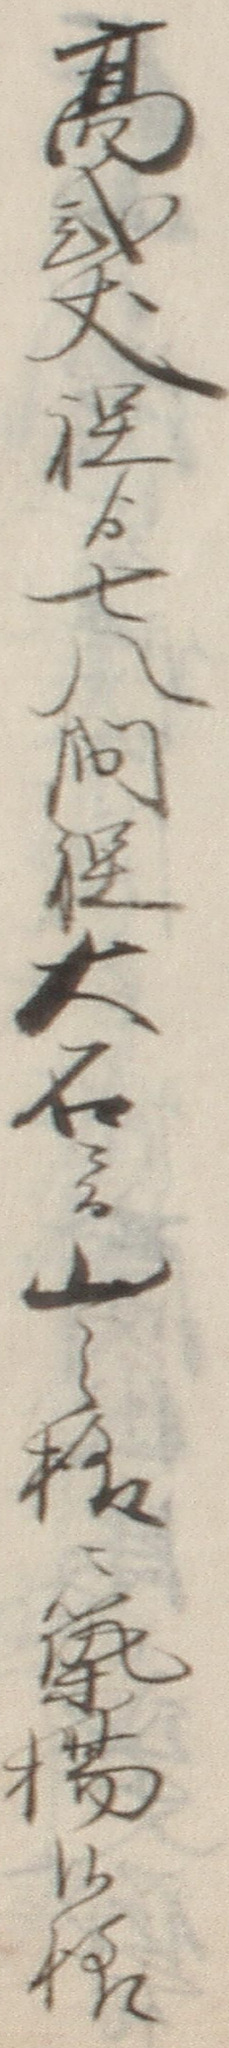高弐丈程ゟ七八間程大石ニ而山之様ニ築場候様
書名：[諸国災害記録]
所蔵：東京大学地震研究所図書室 Earthquake Research Institute Library, The University of Tokyo, JAPAN
